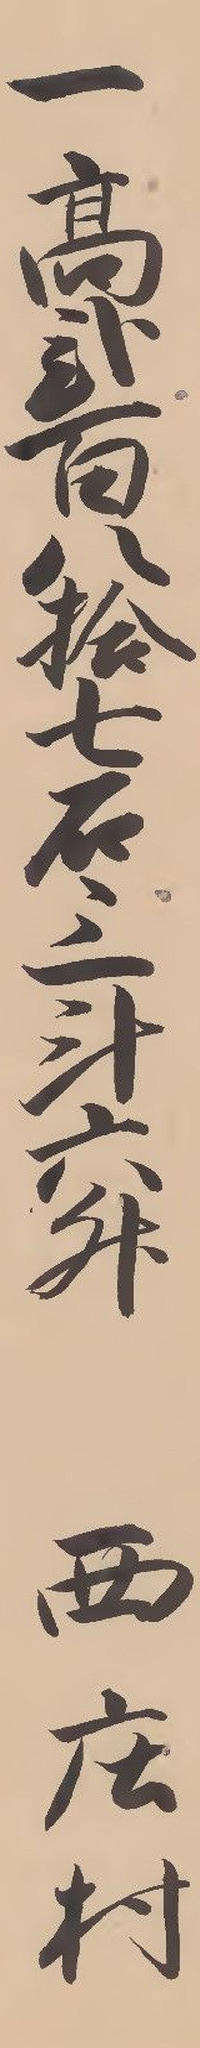一高弐百八拾七石三斗六升西庄村
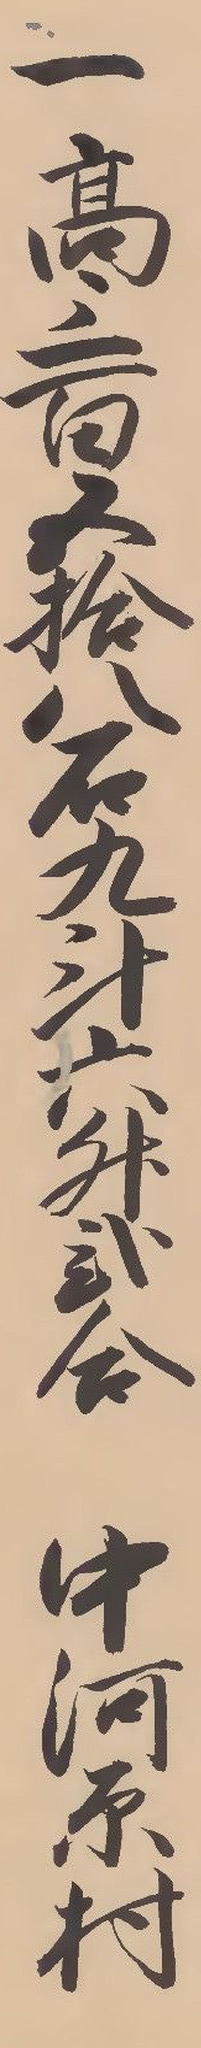一高三百五拾八石九斗六升弐合中河原村

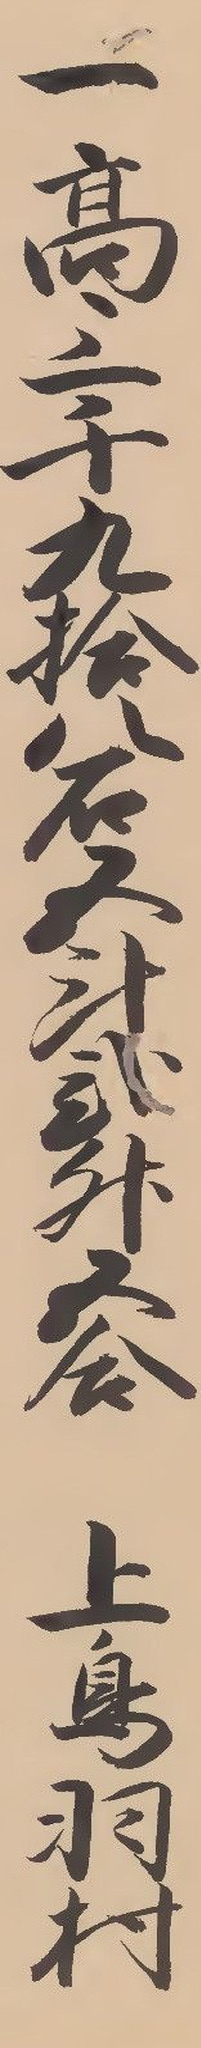一高三千九拾八石五斗弐升五合上鳥羽村
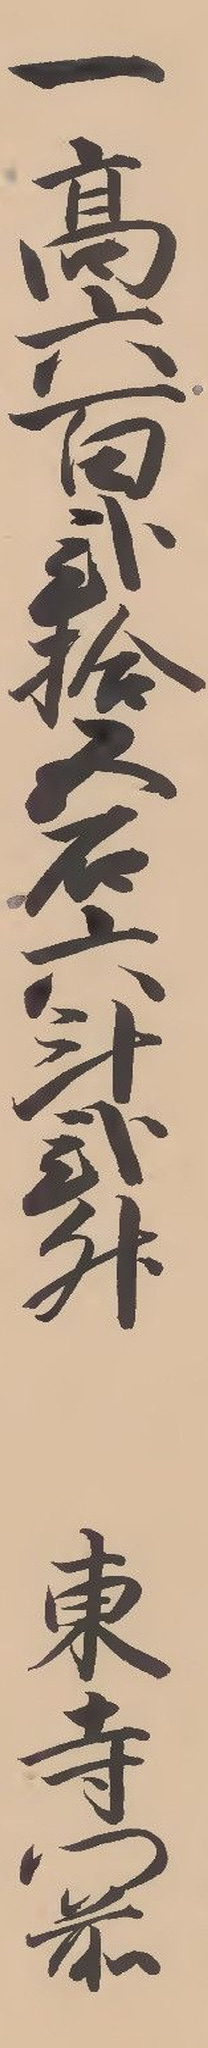一高六百弐拾五石六斗弐升東寺門前
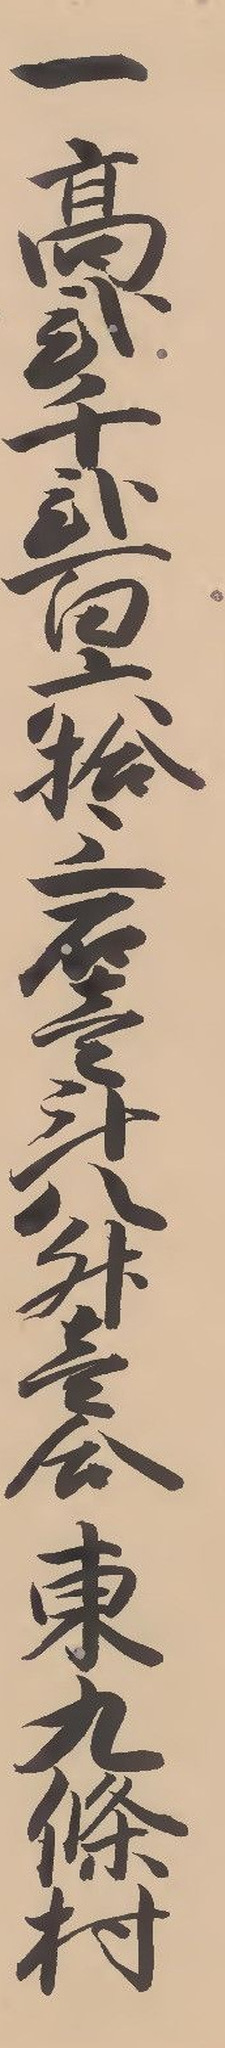一高弐千弐百六拾三石壱斗八升壱合東九条村
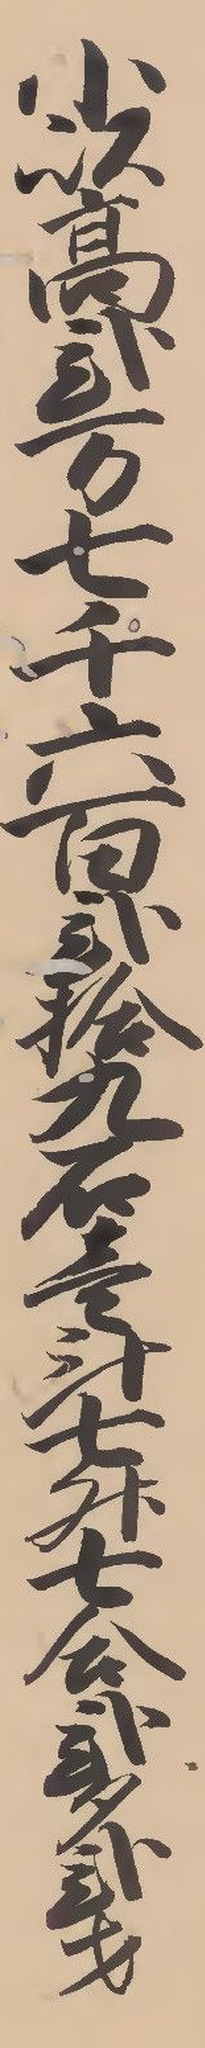小以高弐万七千六百弐拾九石壱斗七升七合弐勺弐才

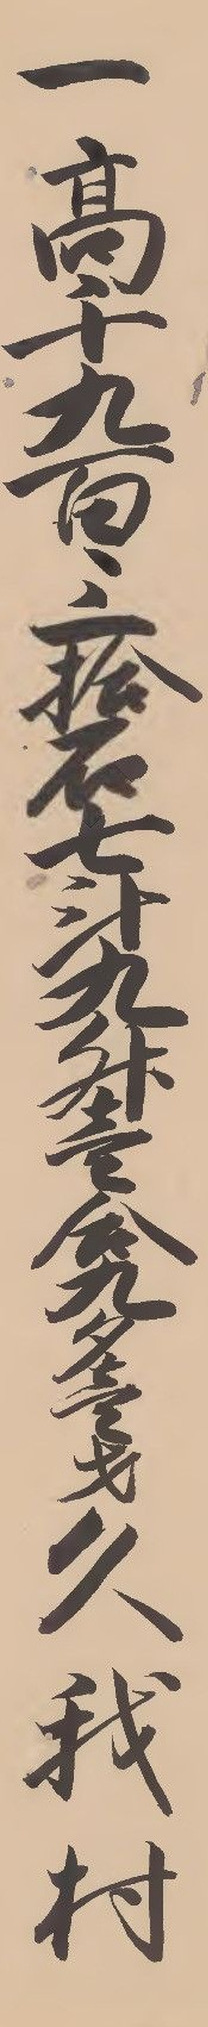一高千九百三拾石七斗九升壱合九勺壱才久我村
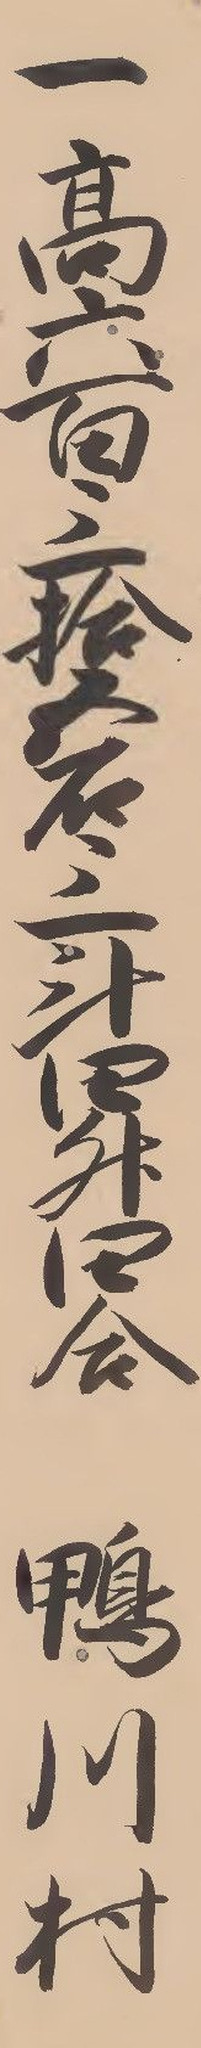一高六百三拾五石三斗四升四合鴨川村
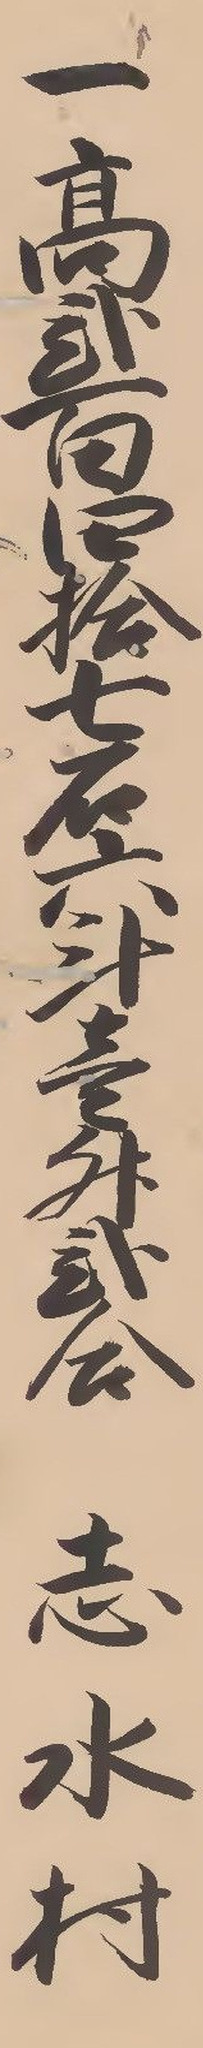一高弐百四拾七石六斗壱升弐合志水村
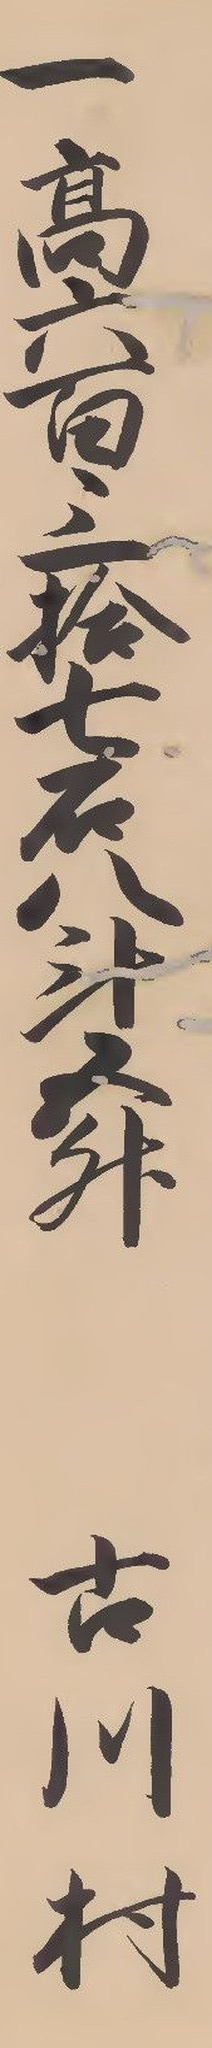一高六百三拾七石八斗五升古川村
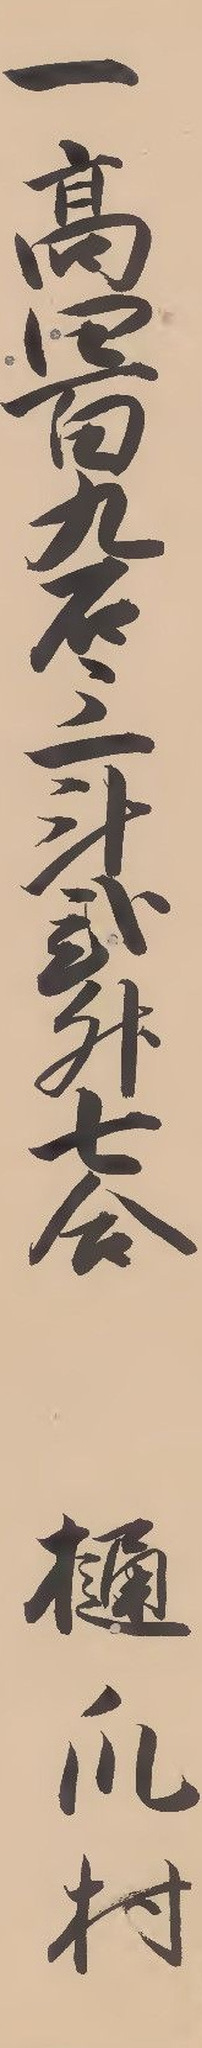一高四百九石三斗弐升七合樋瓜村
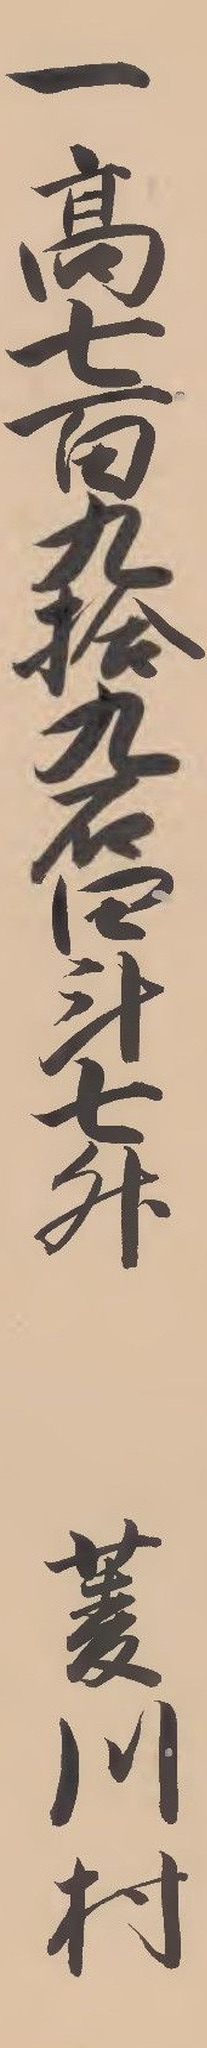一高七百九拾九石四斗七升菱川村
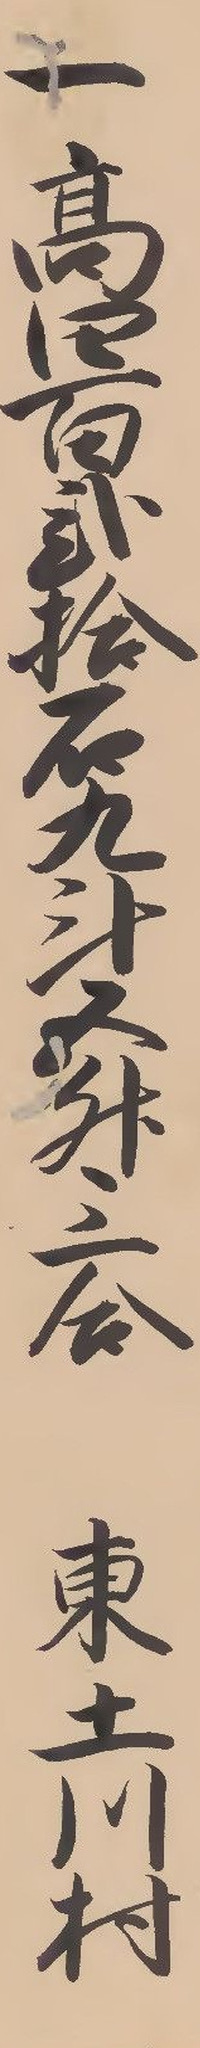一高四百弐拾石九斗五升三合東土川村

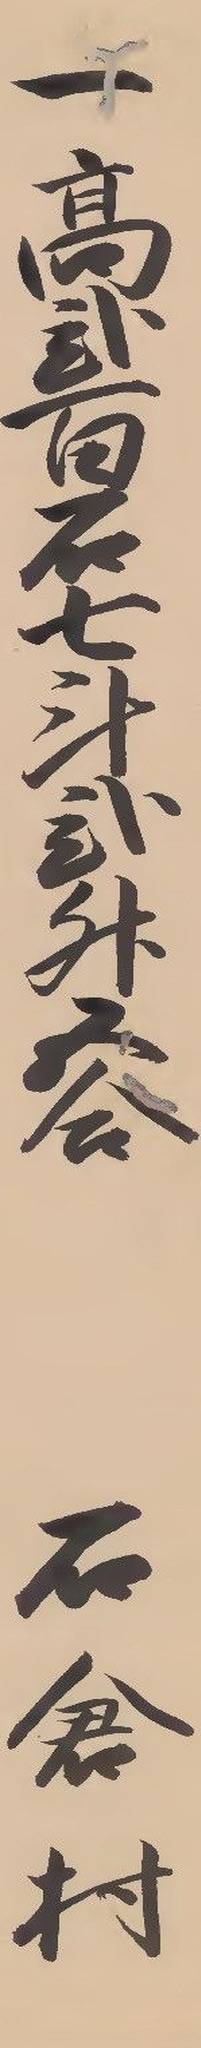一高弐百石七斗弐升五合石倉村
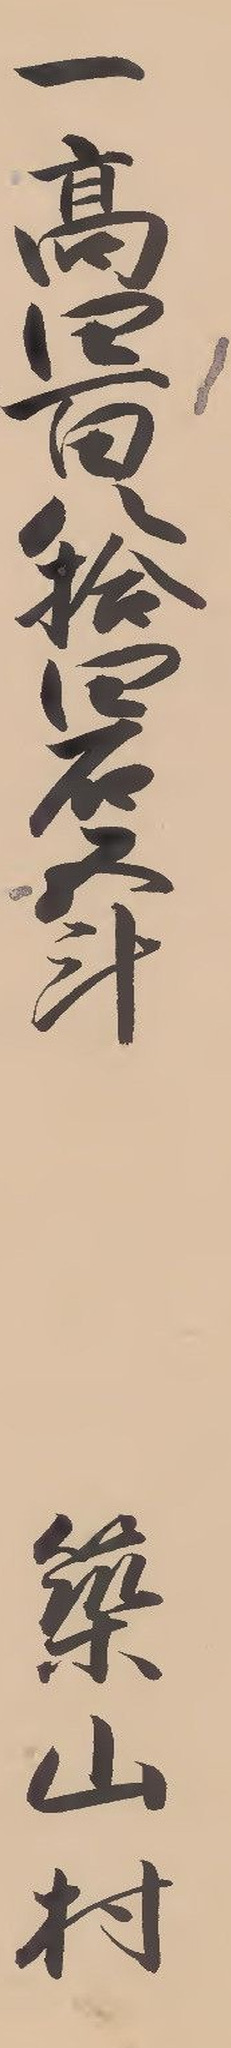一高四百八拾四石五斗築山村
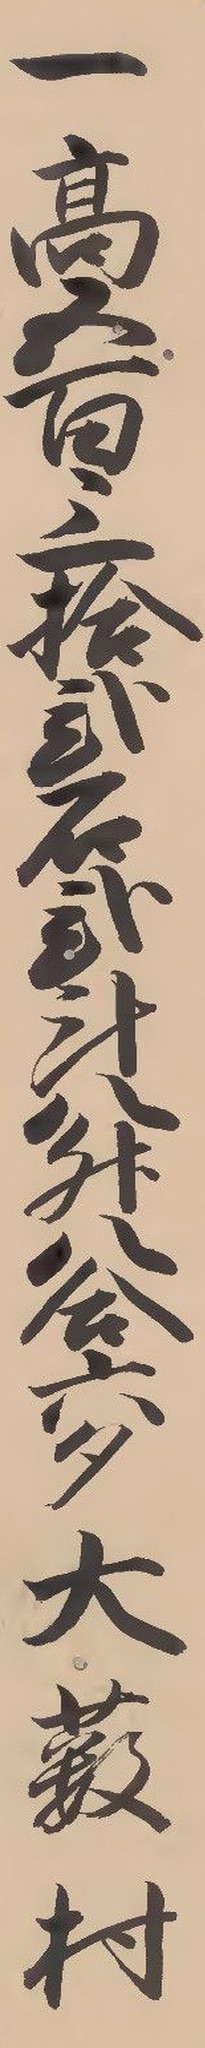一高五百三拾弐石弐斗八升八合六勺大薮村
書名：山城国郷帳
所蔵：国立公文書館 National Archives of Japan
